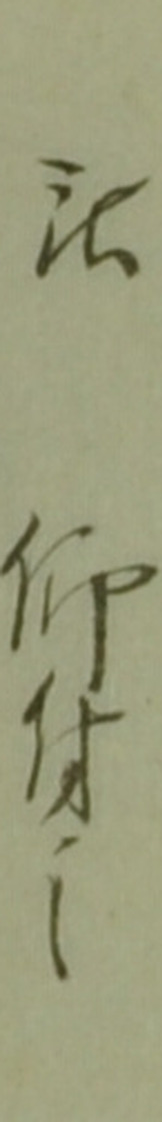被仰付之
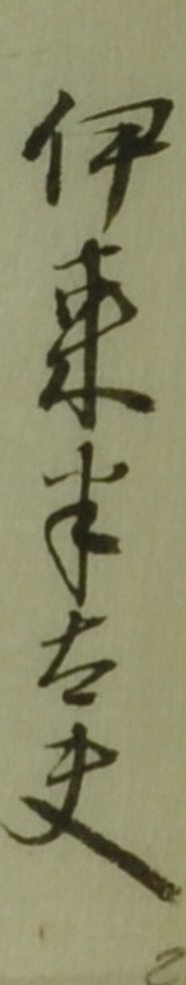伊東半太夫
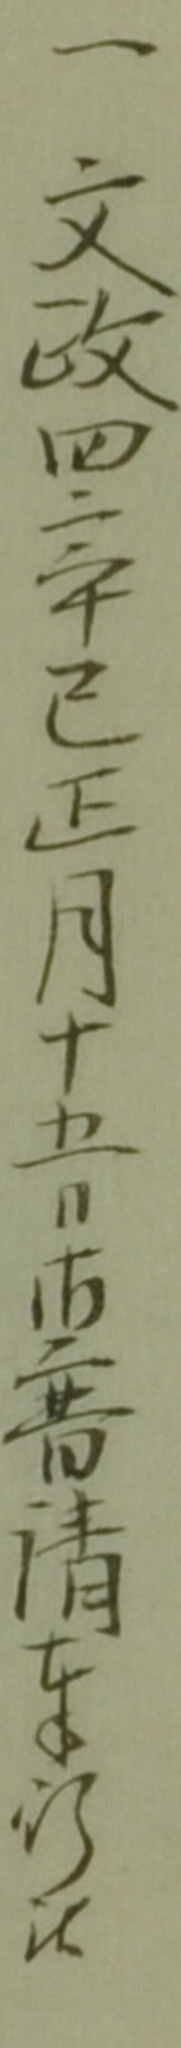一文政四辛巳正月十五日御普請奉行被
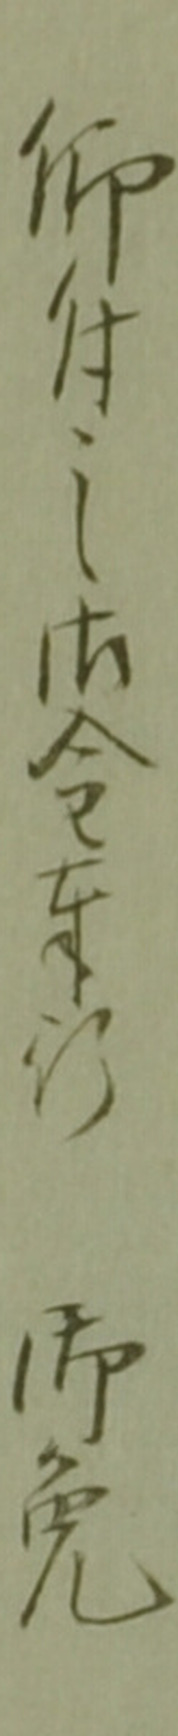仰付之御金奉行御免
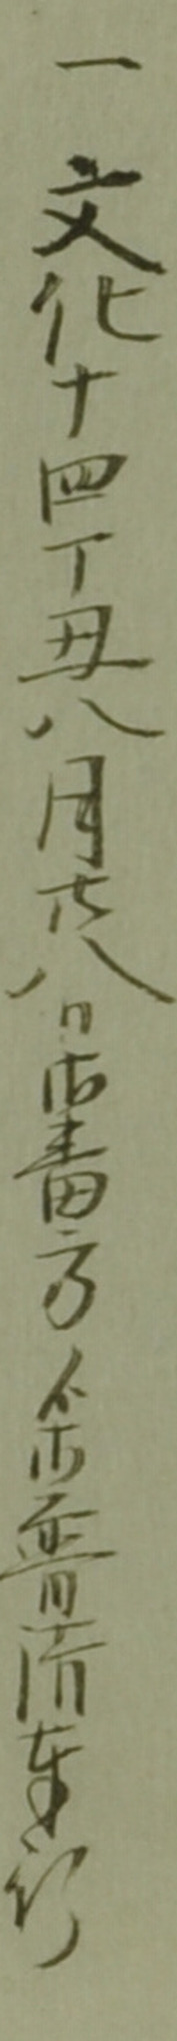一文化十四丁丑八月廿八日御番方ゟ御普請奉行
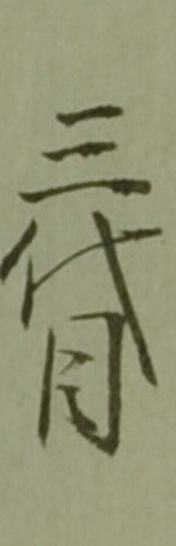三代目
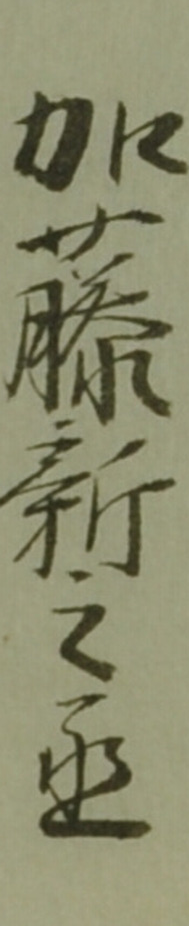加藤新之丞
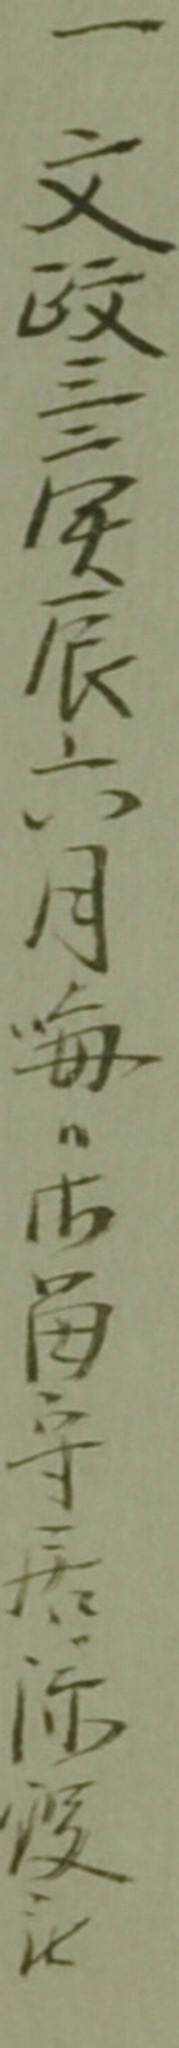一文政三庚辰六月晦日御留守居添役被
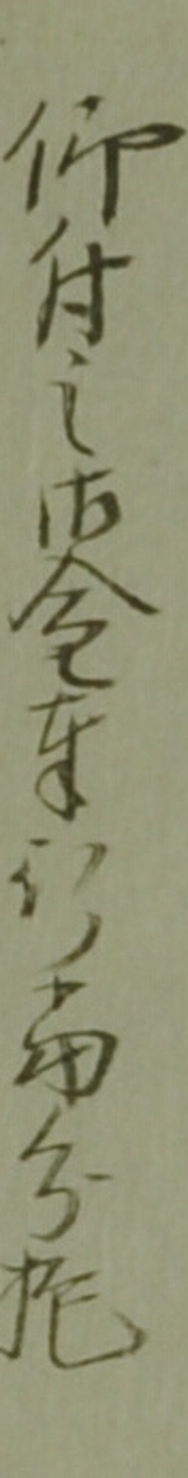仰付之御金奉行当分抱
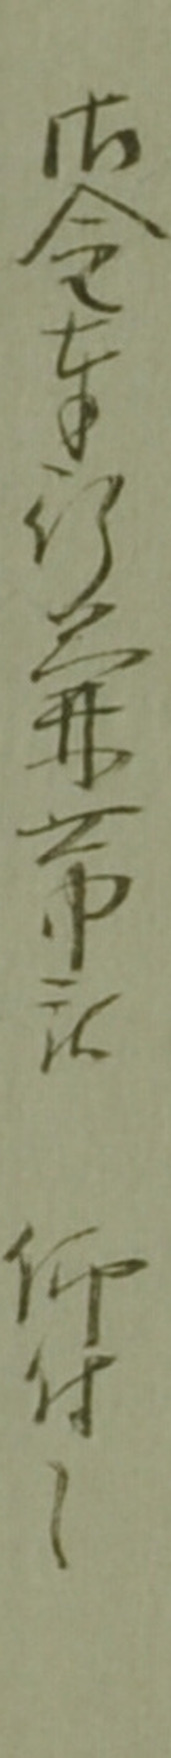御金奉行兼帯被仰付之
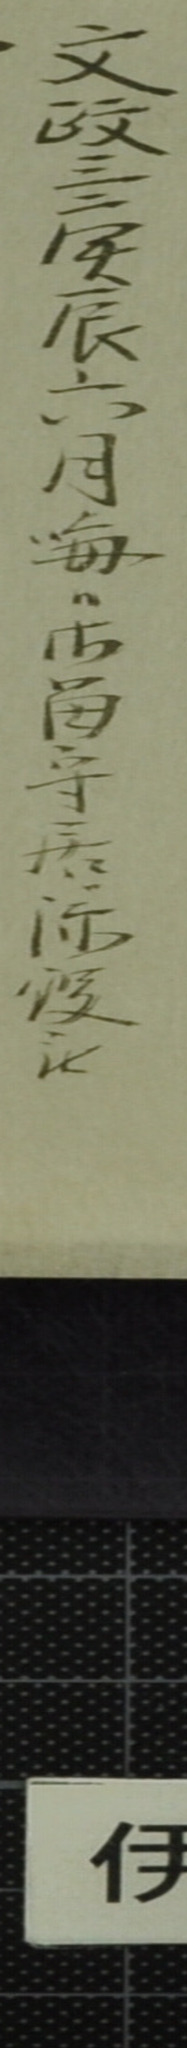一文政三庚辰六月晦日御留守居添役被
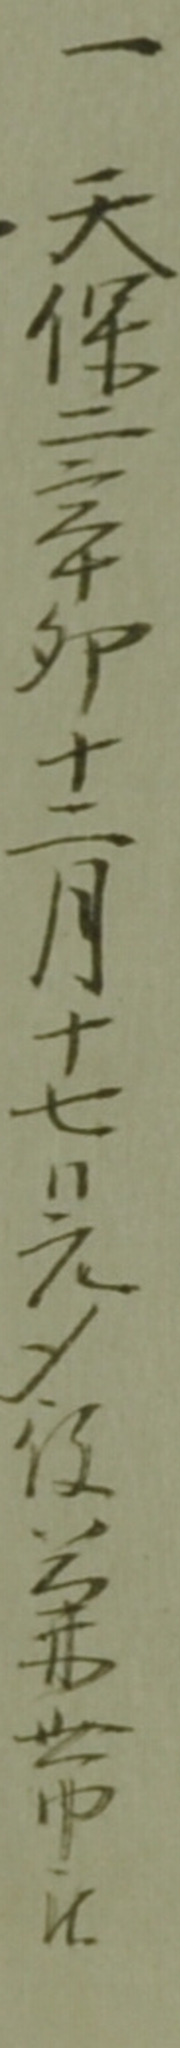一天保二辛卯十二月十七日元〆役兼帯被
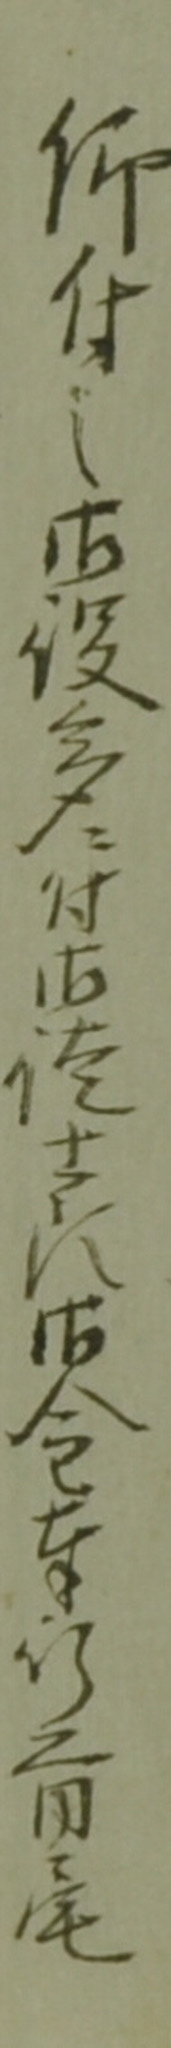仰付之御役多ニ付御徒士頭御金奉行首尾

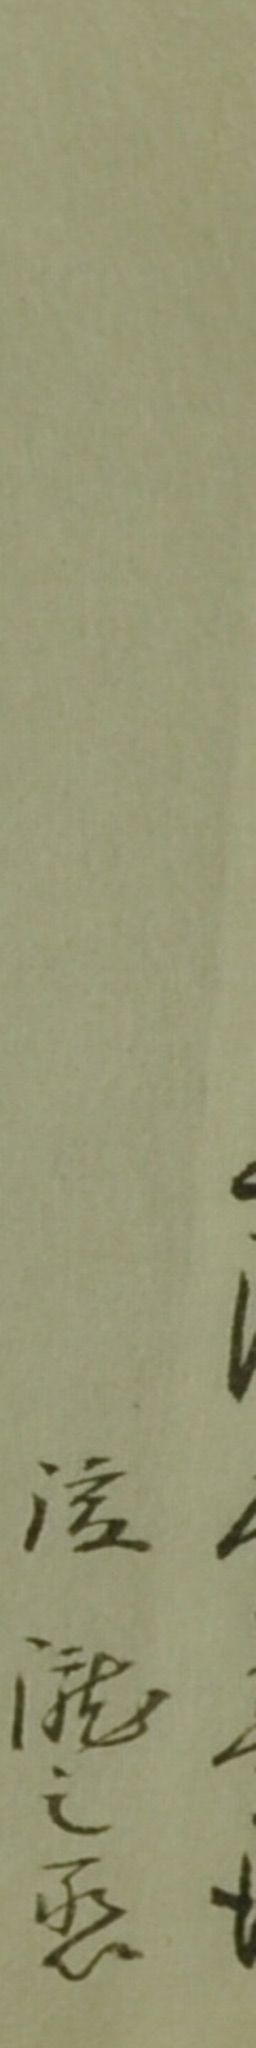後瀧之丞
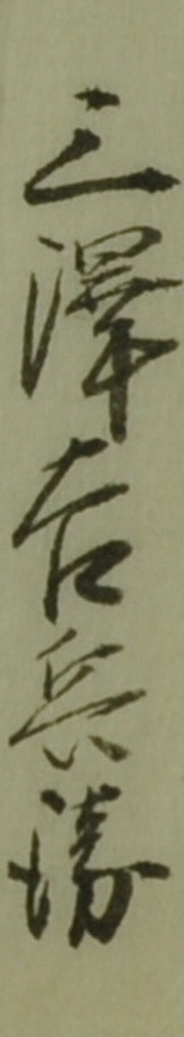三沢吉兵衛
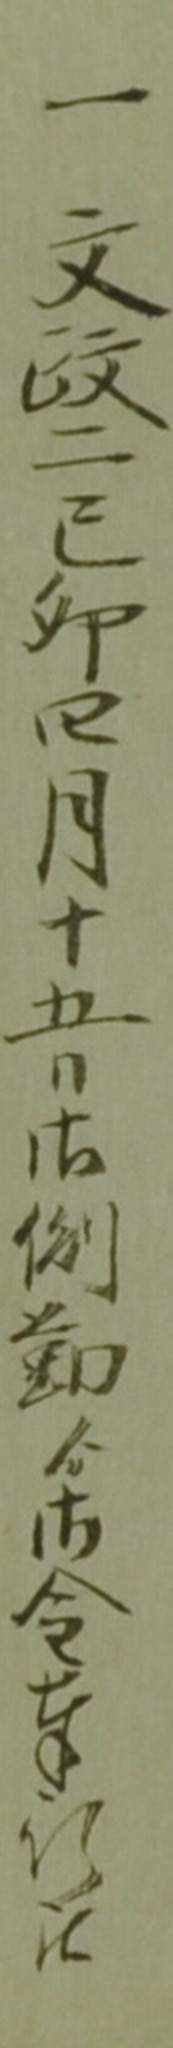一文政二己卯四月十五日御側勤ゟ御金奉行被
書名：諸御役代々録（七）
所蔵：伊那市立高遠町図書館・合同会社AMANE
